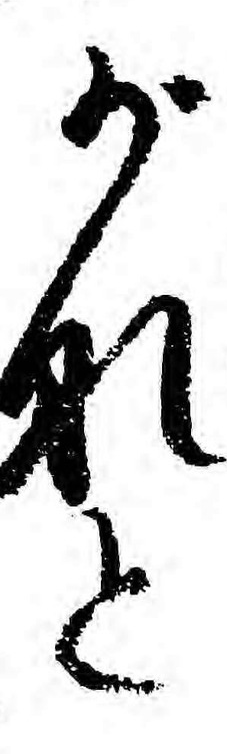がなと
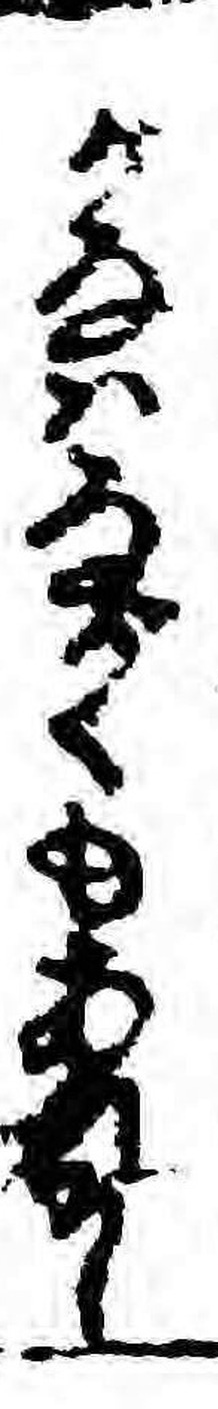がなはながくもあれかし
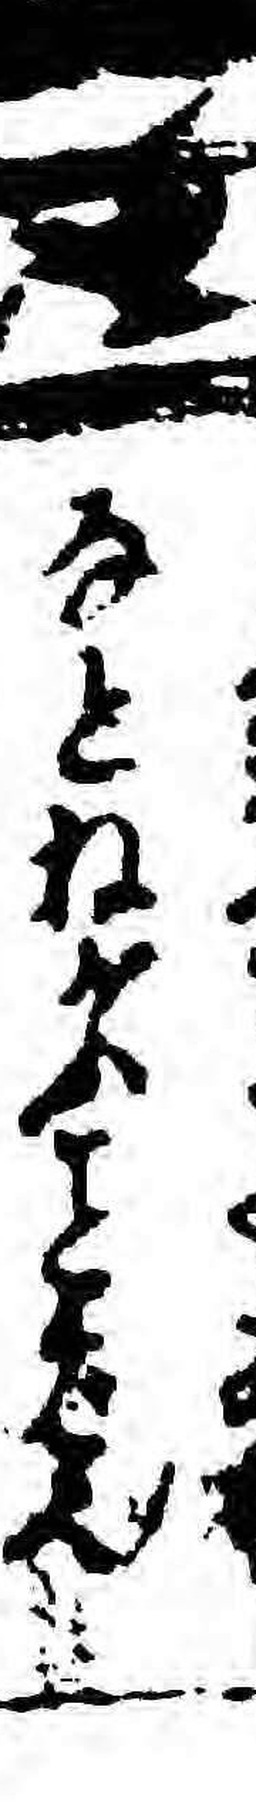なとねがふことば也
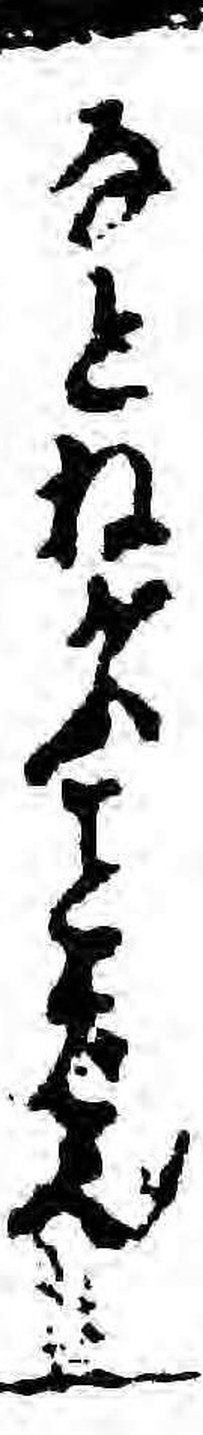なとねがふことば也
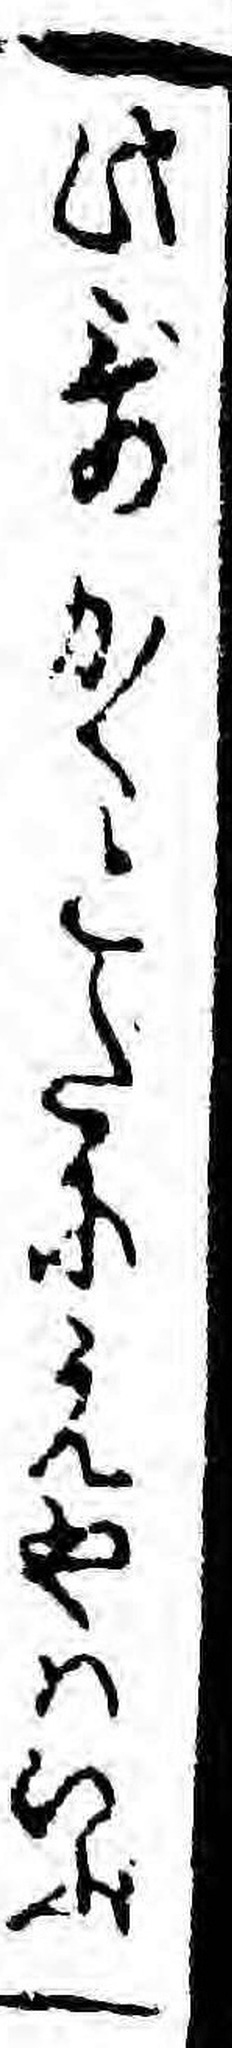此哥かくとたにえやはいぶ
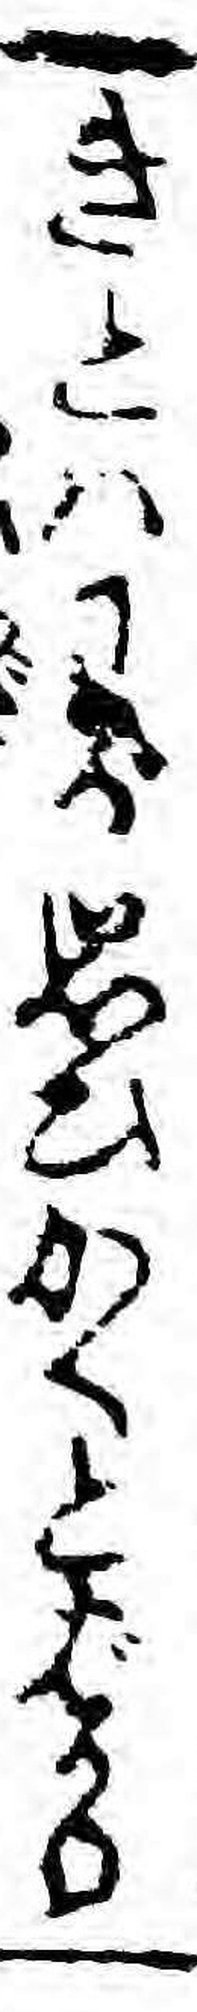きとはわが思ひかくとばかり
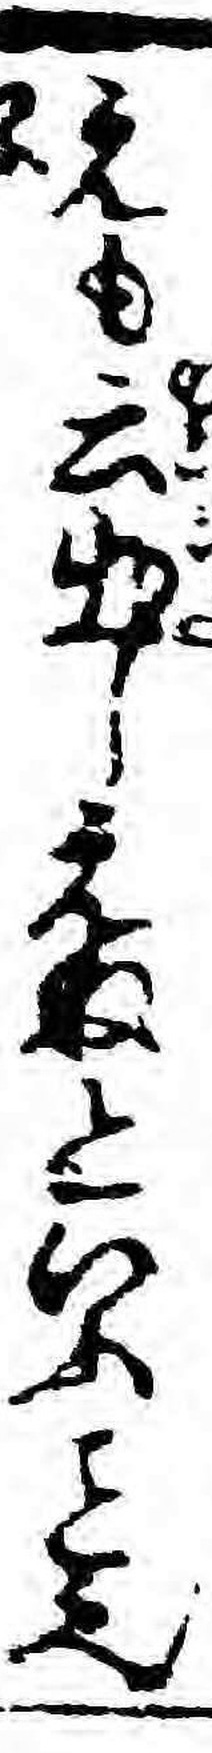えも云出しえぬといふこと也
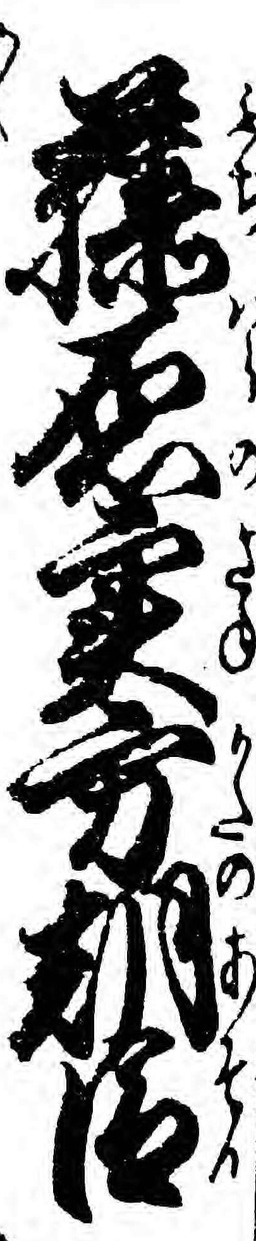藤原実方朝臣
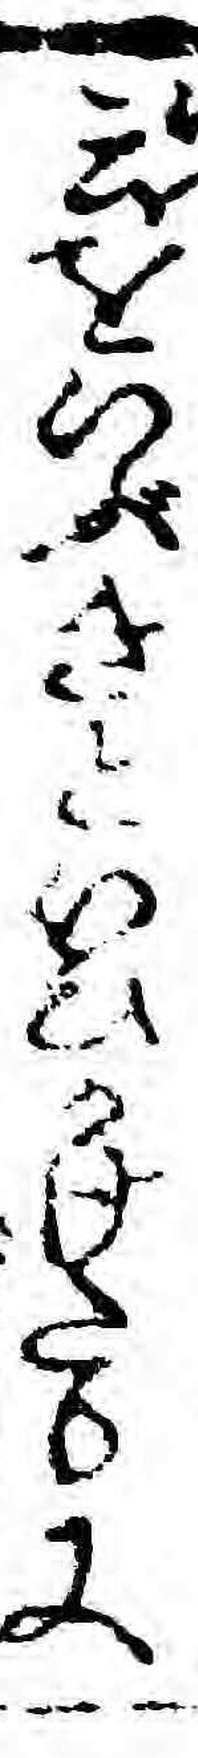云をいぶきといひかけたり又
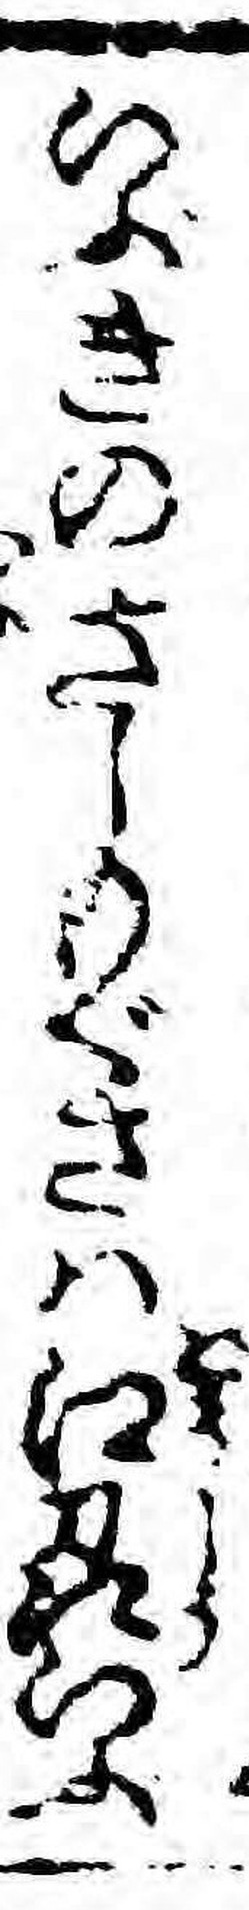いふきのさしもぐさは江州いふ
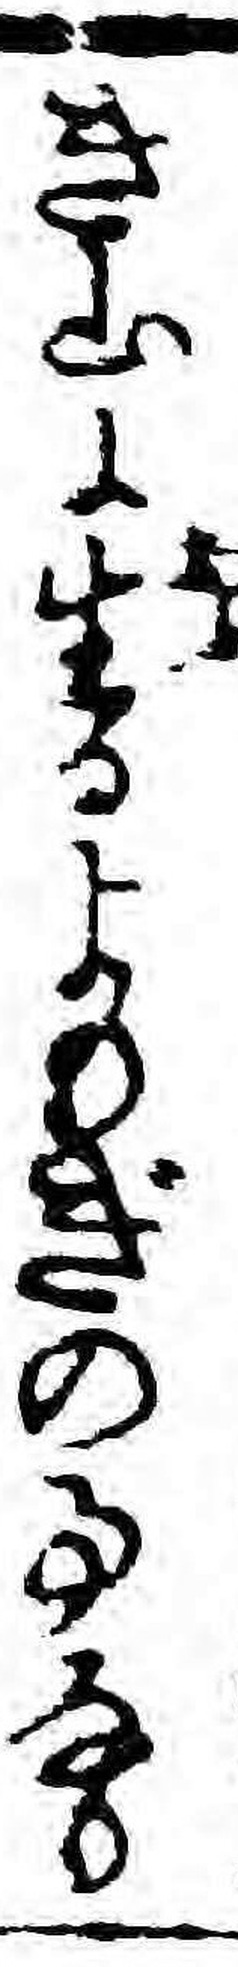き山に生るよもぎのことなり
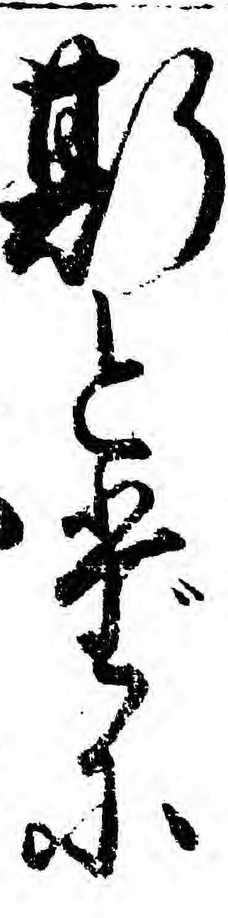斯とだに
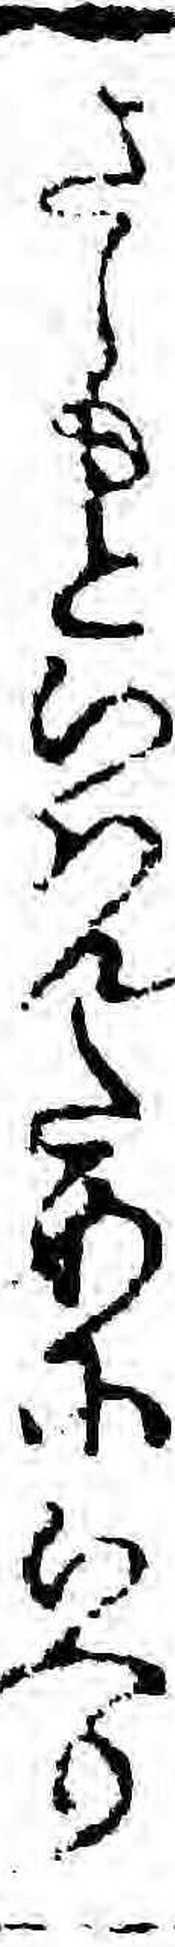さしもといはんためにいへり
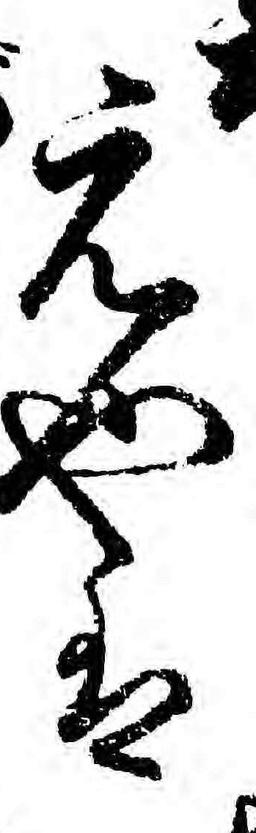えやは
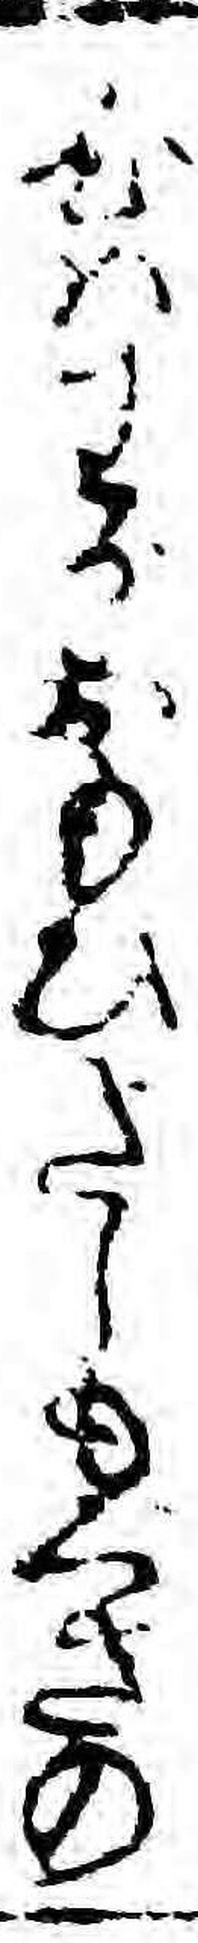心はわがおもひさしもくさの
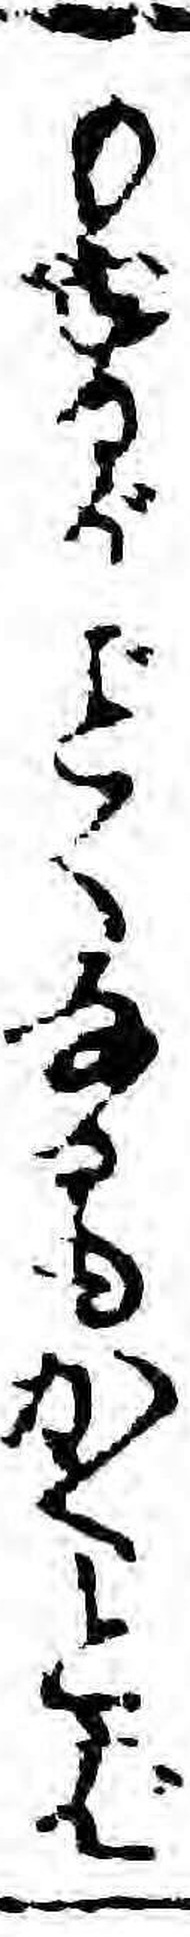もゆるがごとくなるもかくとば
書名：頭書和歌注譯／壽賀多百人一首小倉錦
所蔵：国文学研究資料館
